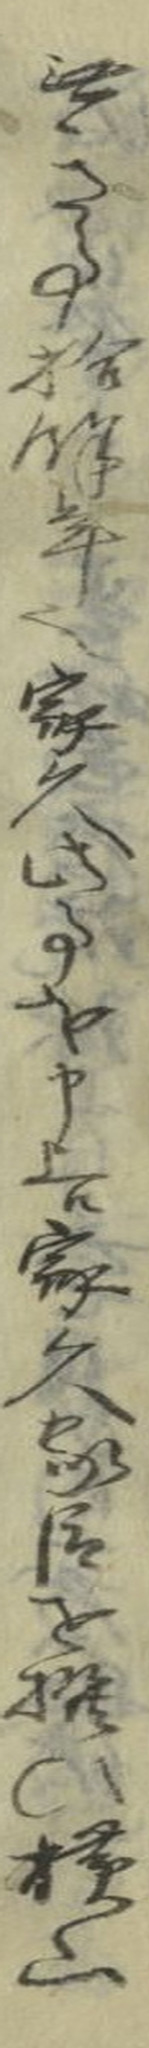無き事拾余年也家久此事を申上る家久家臣を撰び横山
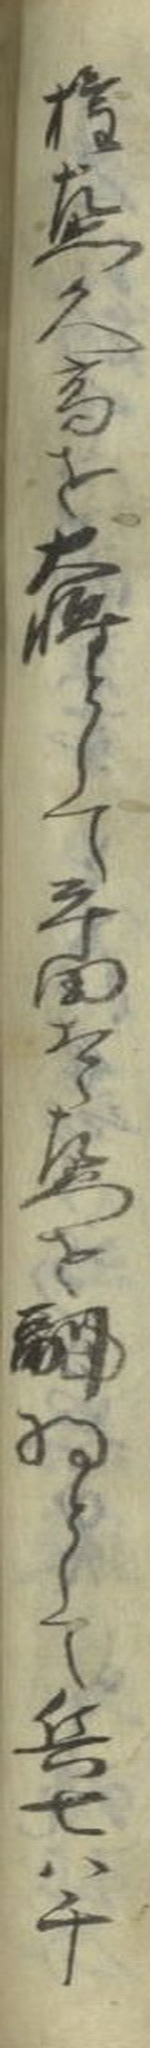権左衛門久高を大将として平間太郎左衛門を副将として兵七八千
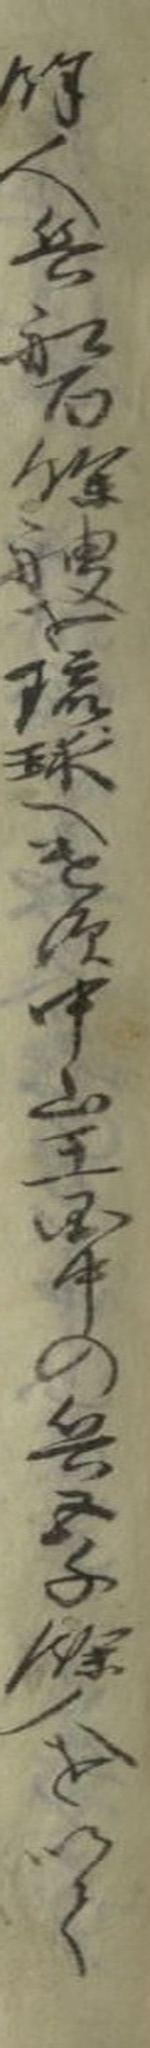余人兵舩百余艘を琉球へ遣す中山王国中の兵五千余人を以て
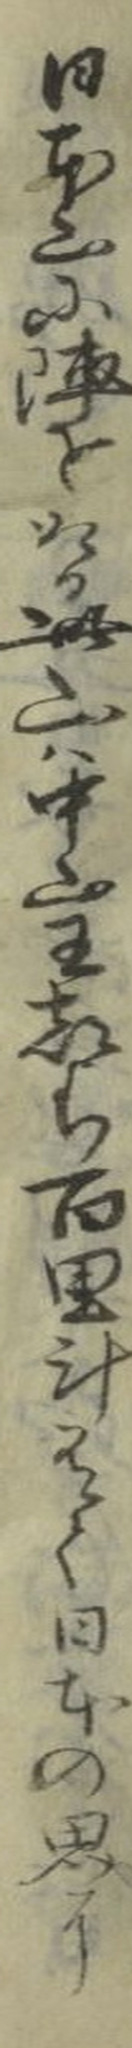日本山に陣を取る此山は中山王都より百里計有て日本の界に
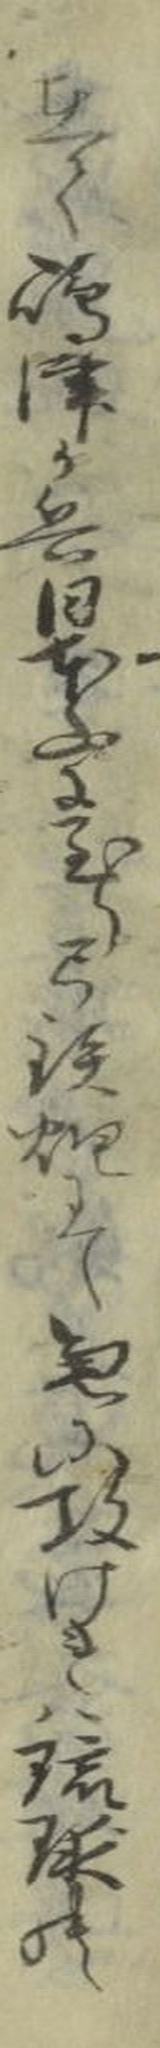在て嶋津か兵日本山に至り弓鉄炮にて急に攻けれは琉球の
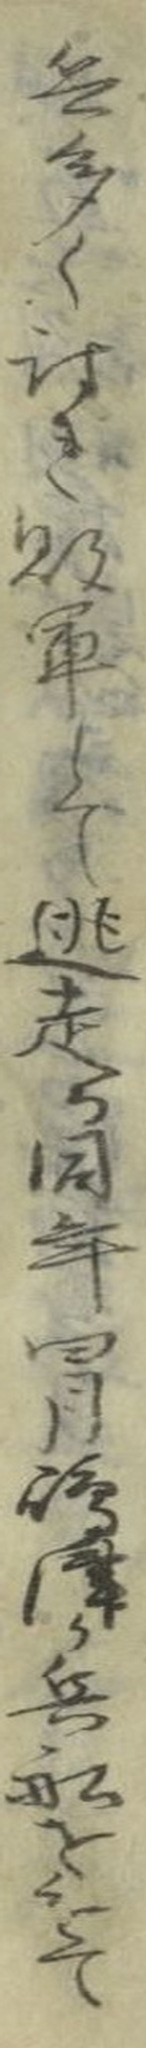兵多く討れ敗軍して逃走り同年四月嶋津か兵舩を進て
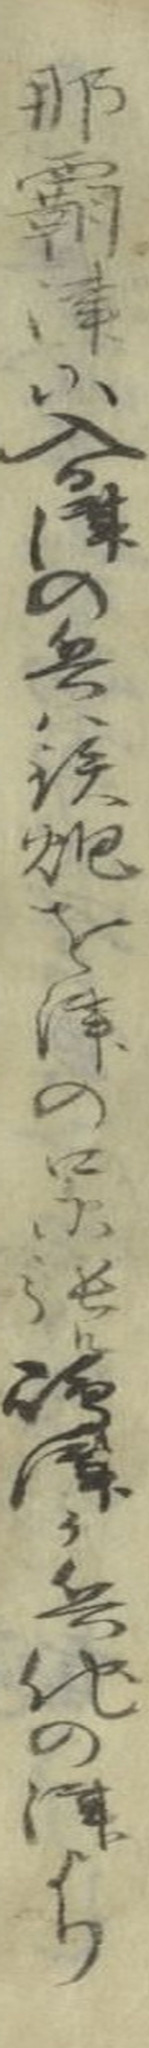那覇津に入る津の兵は鉄炮を津の口に張る嶋津か兵他の津より
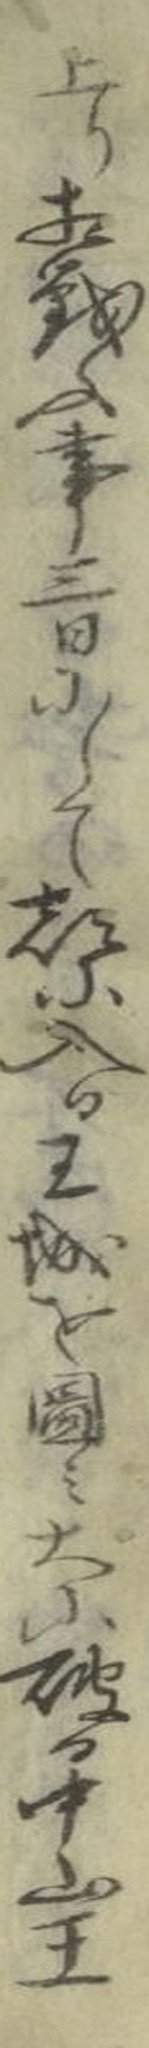上り相戦ふ事三日にして都に入る王城を囲み大に破る中山王
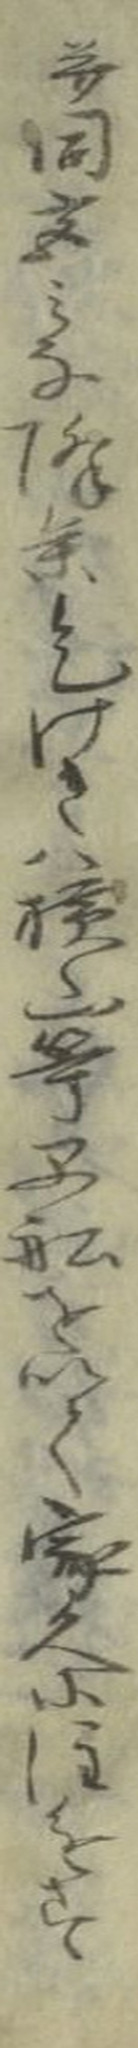並同宮みな降参令けれは横山等早舩を以て家久に注進す
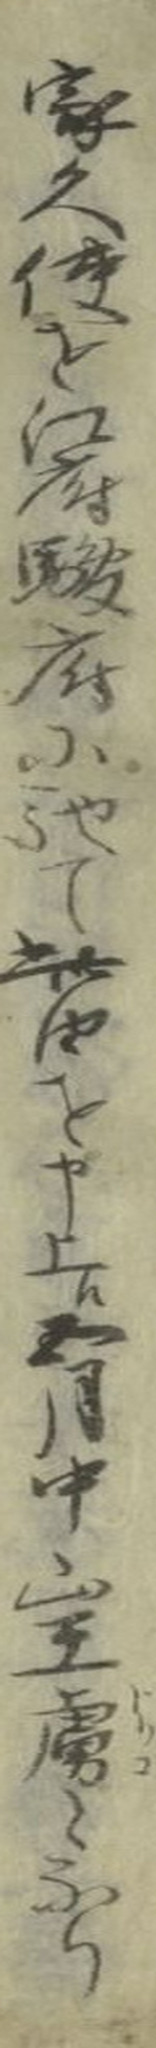家久使を江府駿府に馳て此由を申上る五月中山王虜となり
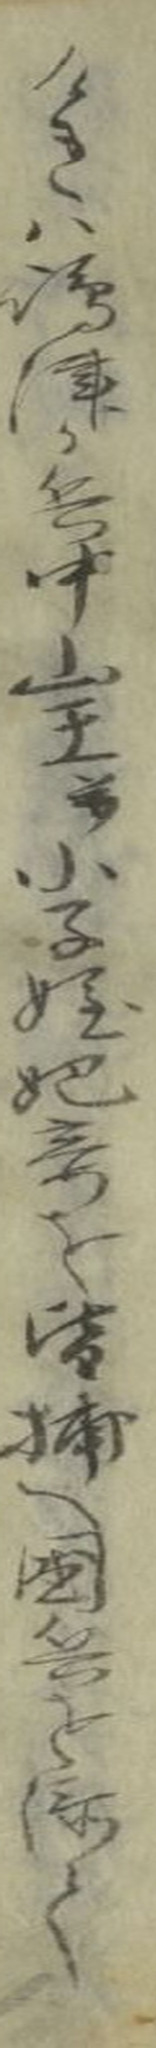けれは嶋津か兵中山王並小子姪妃妾を皆捕へ国兵を添て
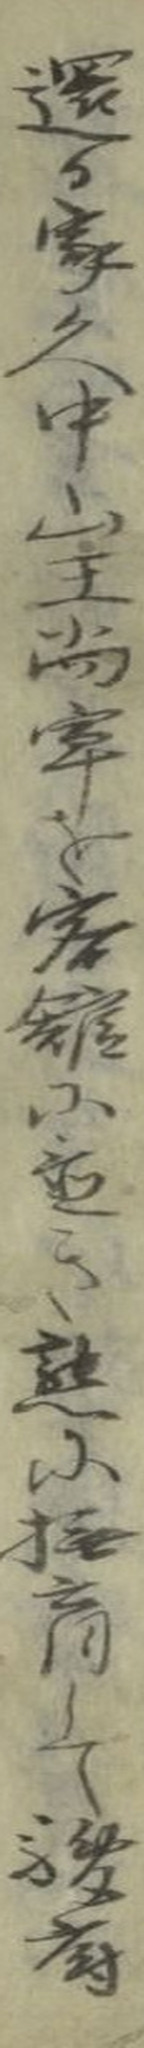還る家久中山王尚寧を客舘に置き懇に撫育して駿府
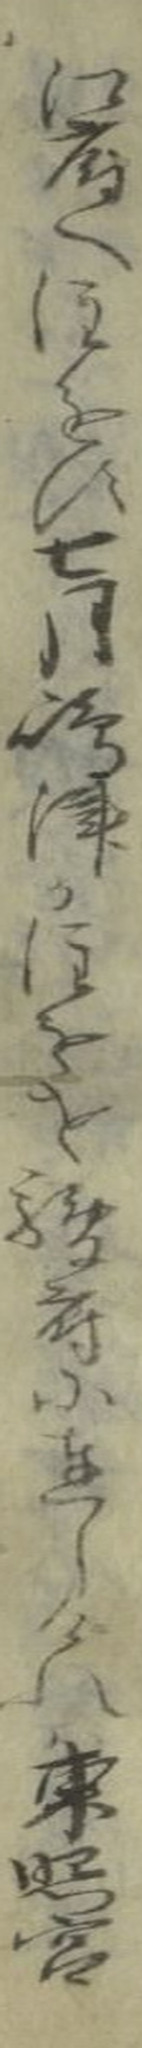江府へ注進す七月嶋津か注進を駿府に達しけれ東照宮
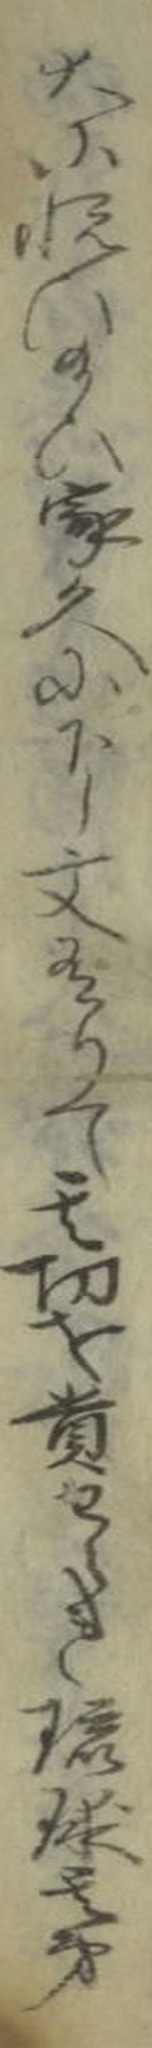大に悦ひ給ひ家久に下し文有りて其功を賞せられ琉球其弟

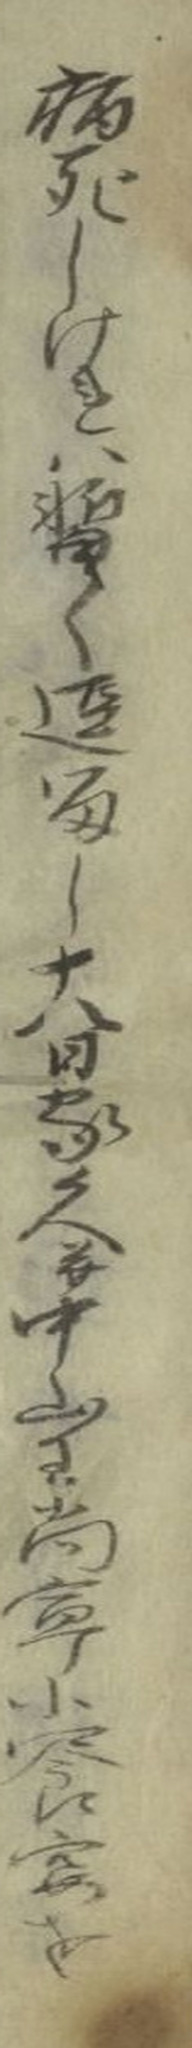病死けれは暫く逗留し十八日家久並中山王尚寧に饗宴を
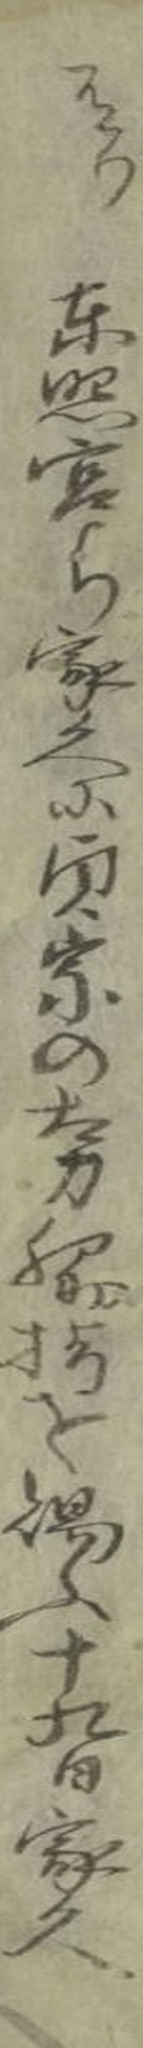有り東照宮より家久に貞宗の太刀脇指を賜ふ十九日家久
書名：琉球人来朝之記
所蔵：University of the Ryukyus Library
